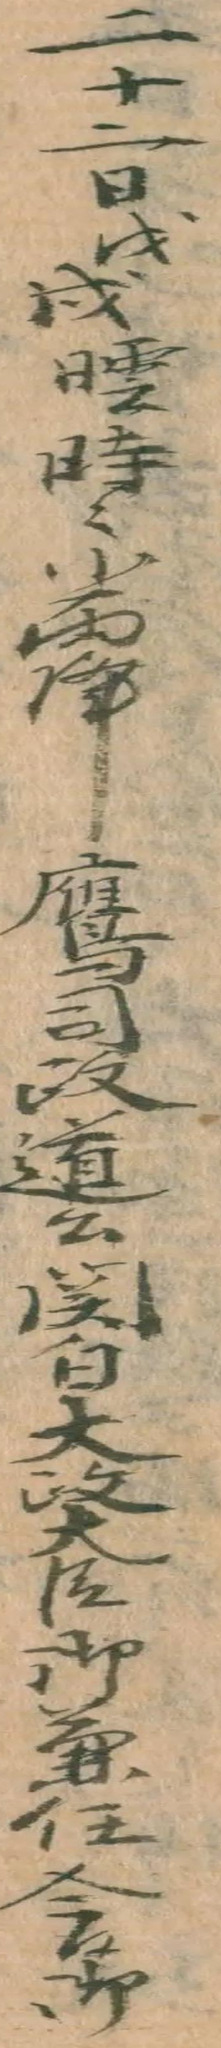二十二日戊戌時々小雨降鷹司政道公関白大政大臣御兼任今日御
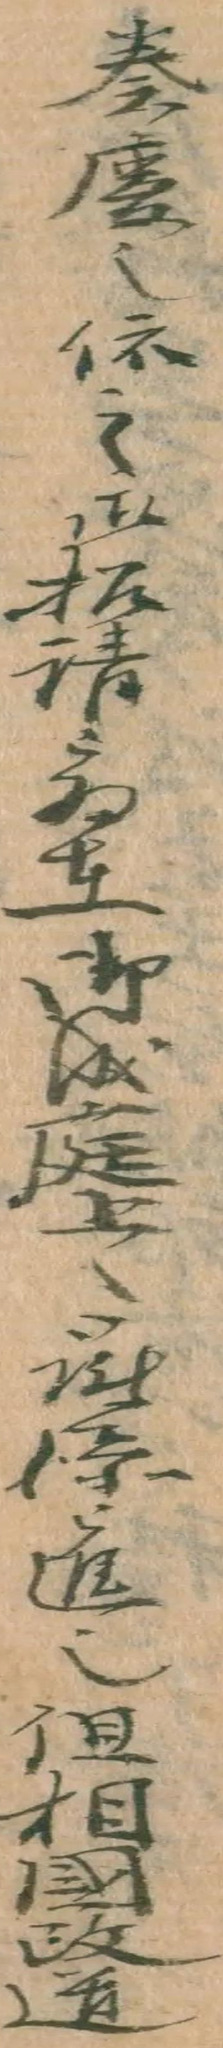奏慶也依之御招請被為在御成庭上へ御附添被進也但相國政道
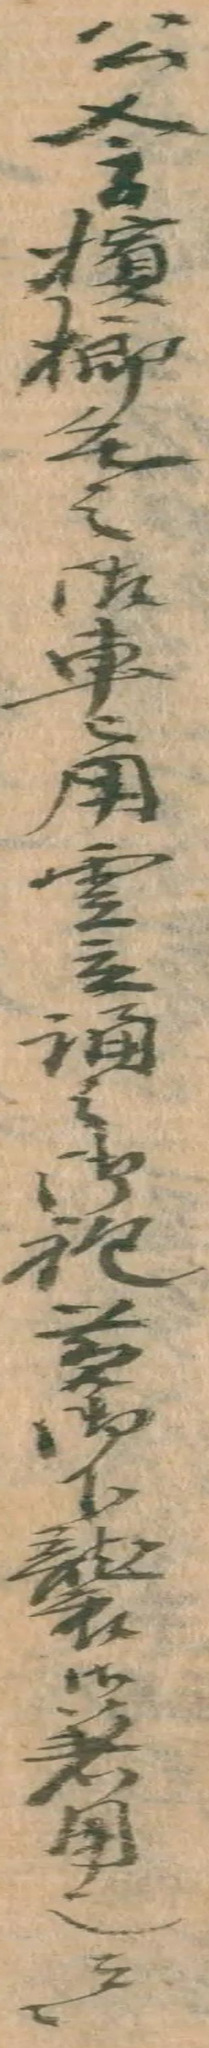公今日檳榔毛之御車被用雲立涌之御袍黄御下襲御着用也云々
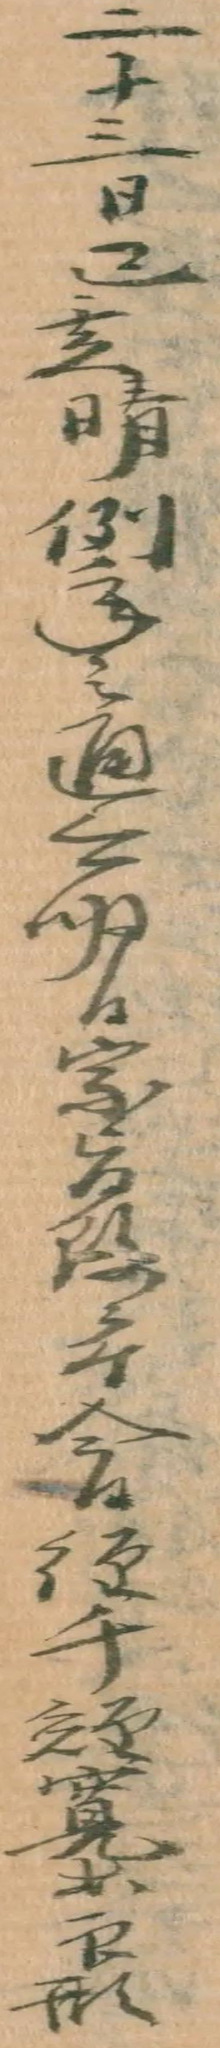二十三日己亥晴例年之通今明日宗旨改ニ付今日経千経寛等印形
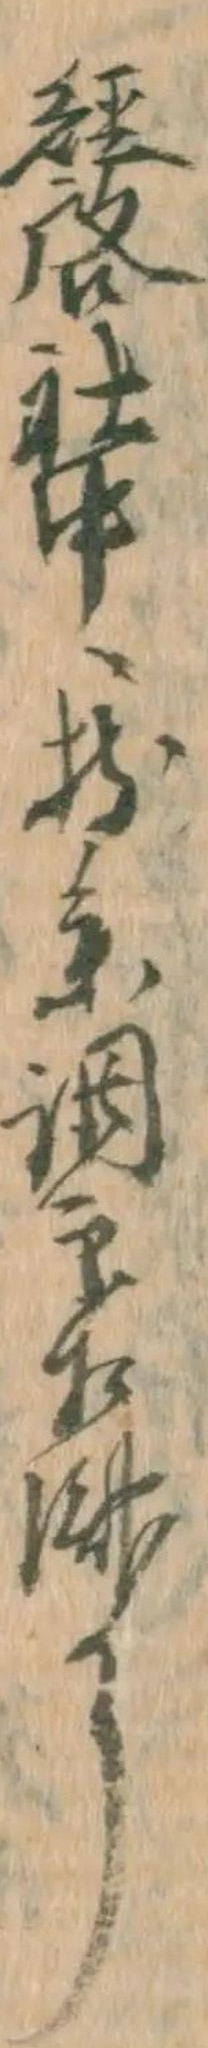経啓社中へ持参調印相済候
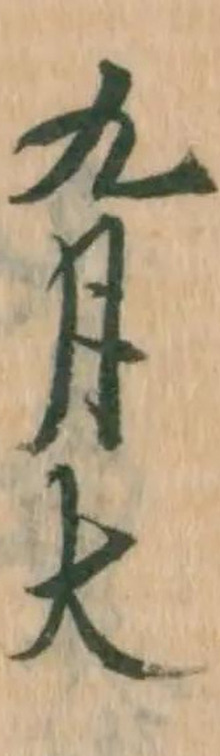九月大
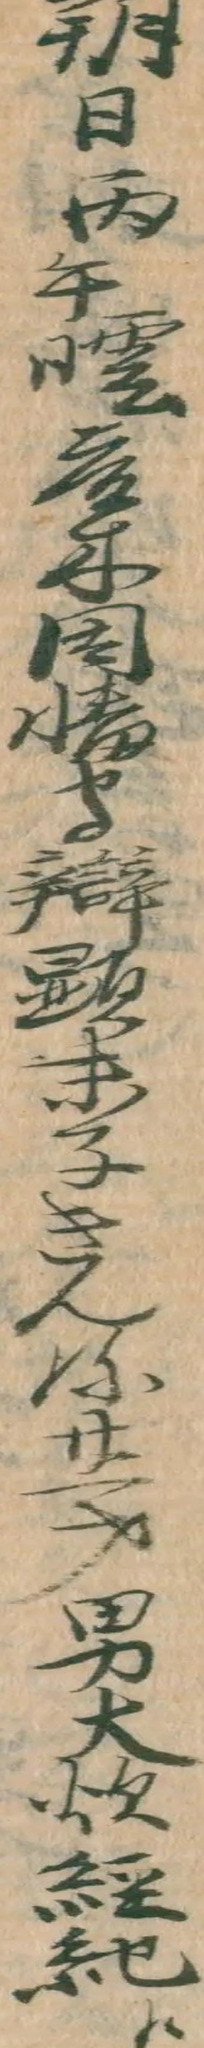朔日丙午曇藤木因幡守辨顕末子きんね廿一才男大炊経紀え
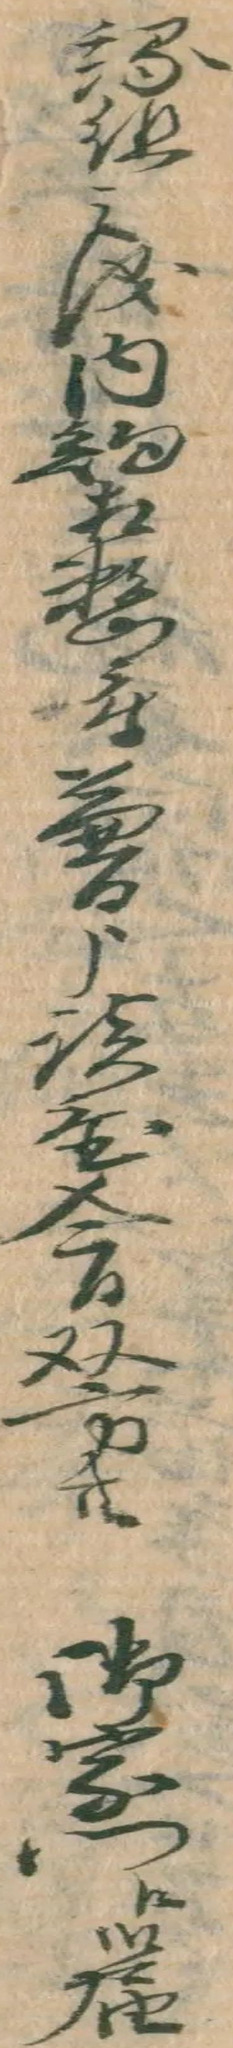縁組之儀内約相整二付兼日申談置今日双方共御家門江御届
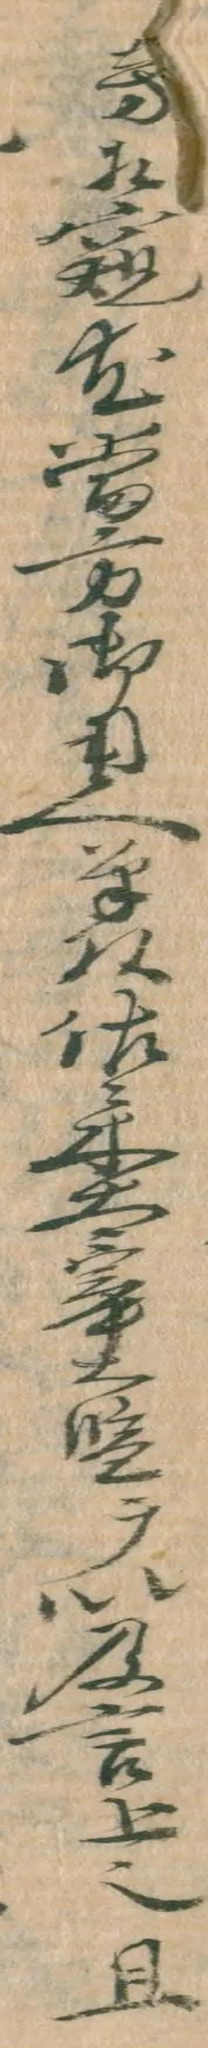旁相窺尤當方御用人筆頭佐々木太宰大監ヲ以及言上也且
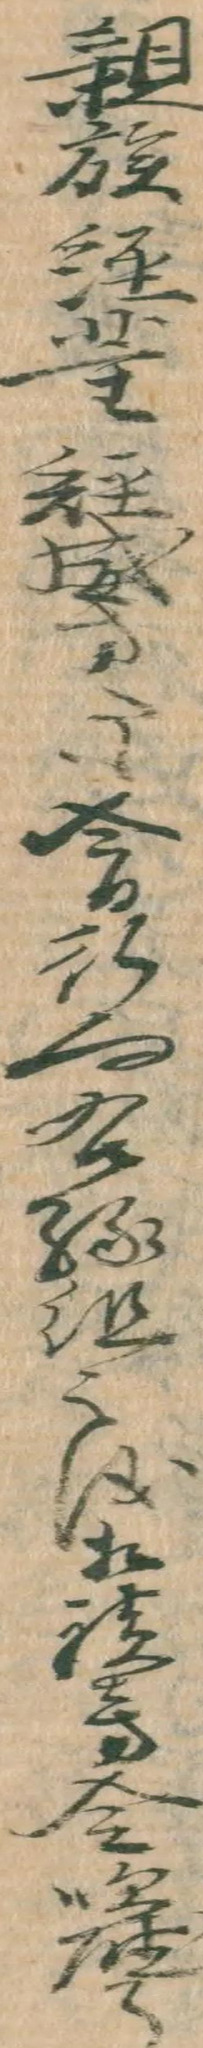親族経董経威方へにも今日行向右縁組之儀相談旁令吹聴了
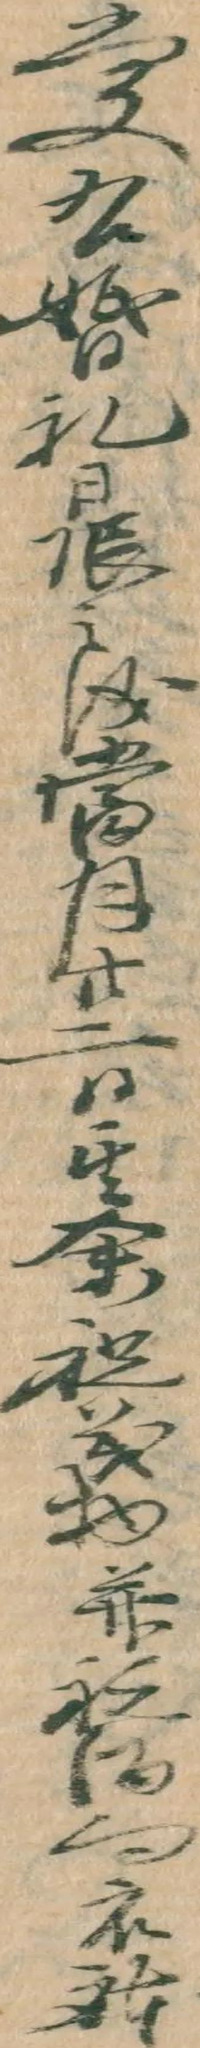尚又右婚礼日限之儀當月廿二日其余祝義物并祝酒向衣躰
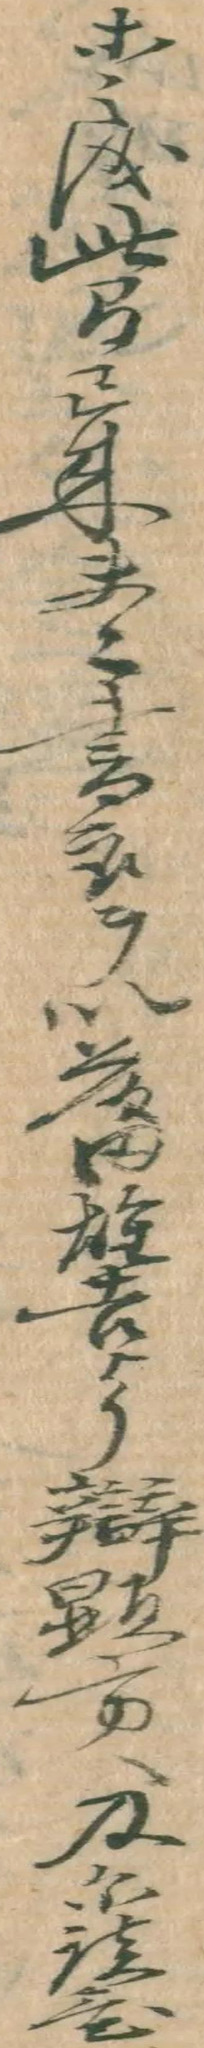等之儀此間已来夫々書記ヲ以藤田雄吉より辨顕方へ及示談置
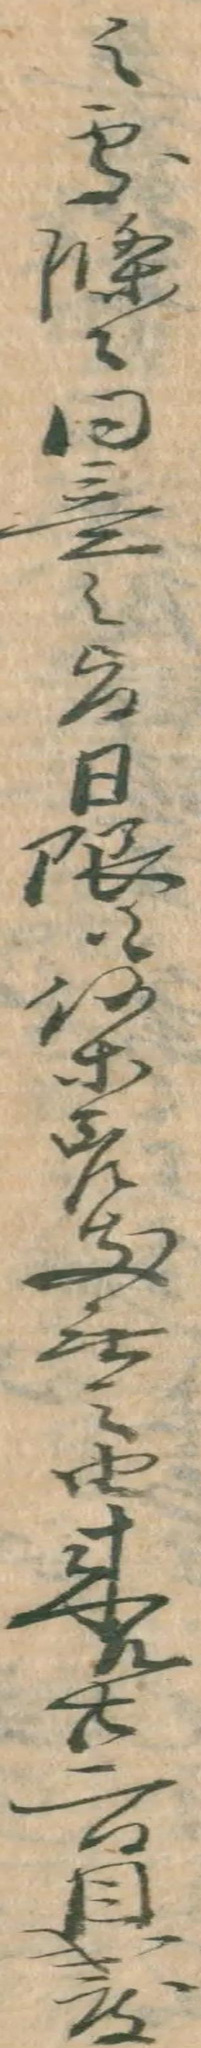之處條々同意之旨日限も何等差支無之由来ル廿二日目出度
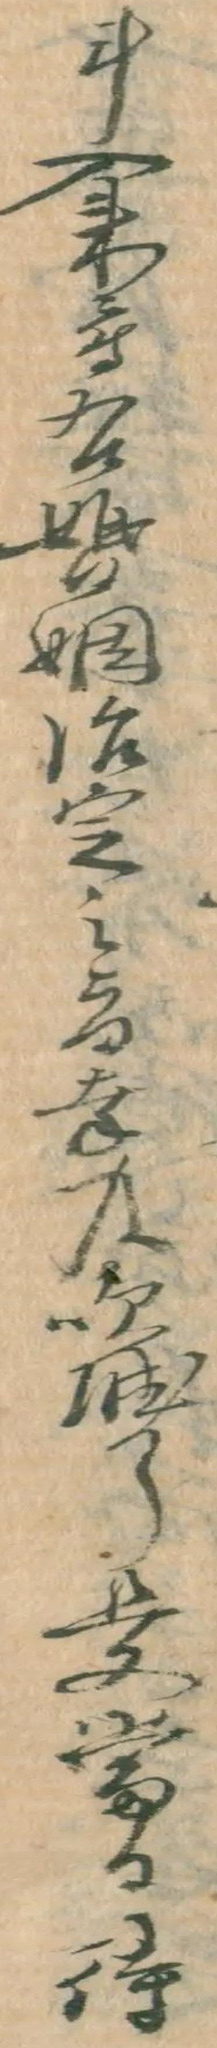斗入来ニ付右婚姻治定之旨達及吹聴了且又當日侍

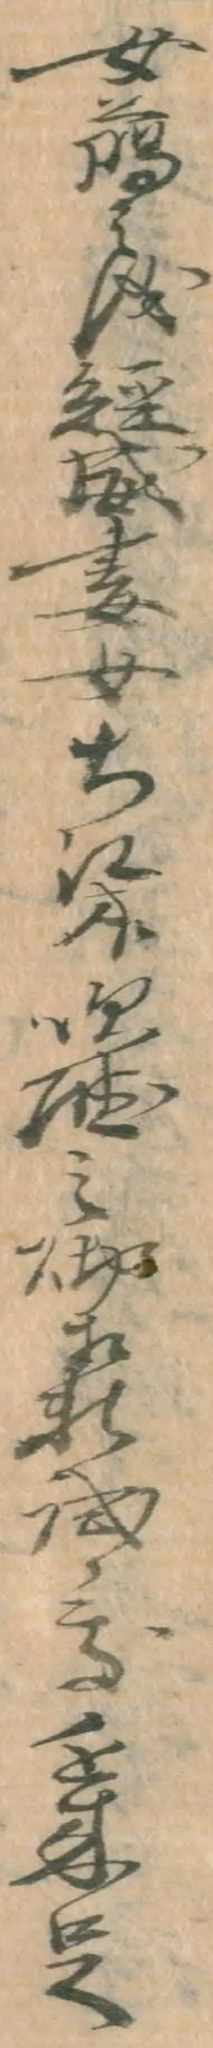女臈之儀経威妻女ち江方吹聴之砌相頼試候處近来足
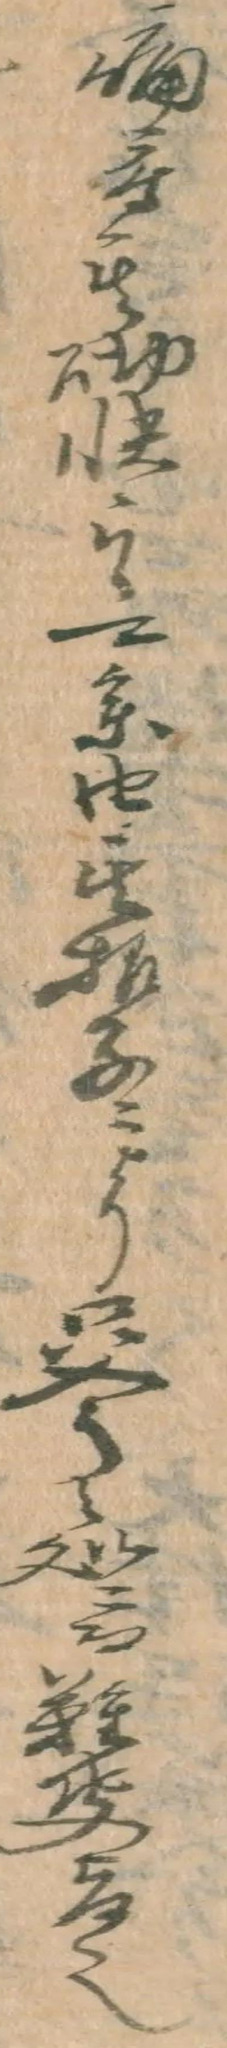痛に付其砌快候ハヽ可参由其様子ニより只今之候処ニ而難決旨也
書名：賀茂社記録. 第69冊
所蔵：国立国会図書館 National Diet Library, JAPAN
